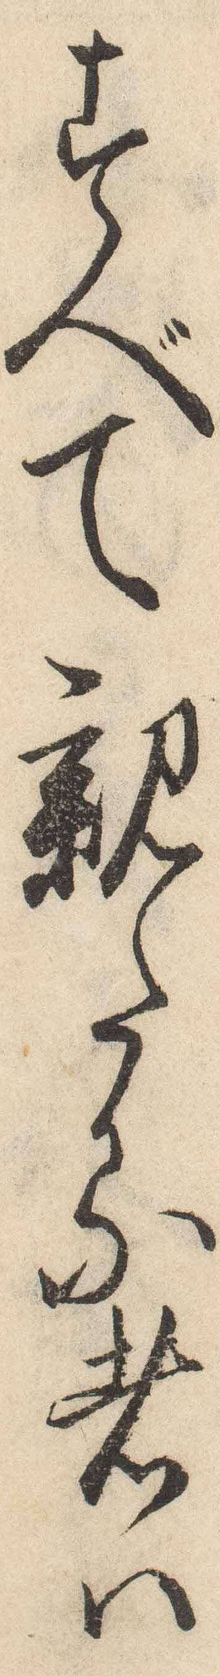すべて親たる者は
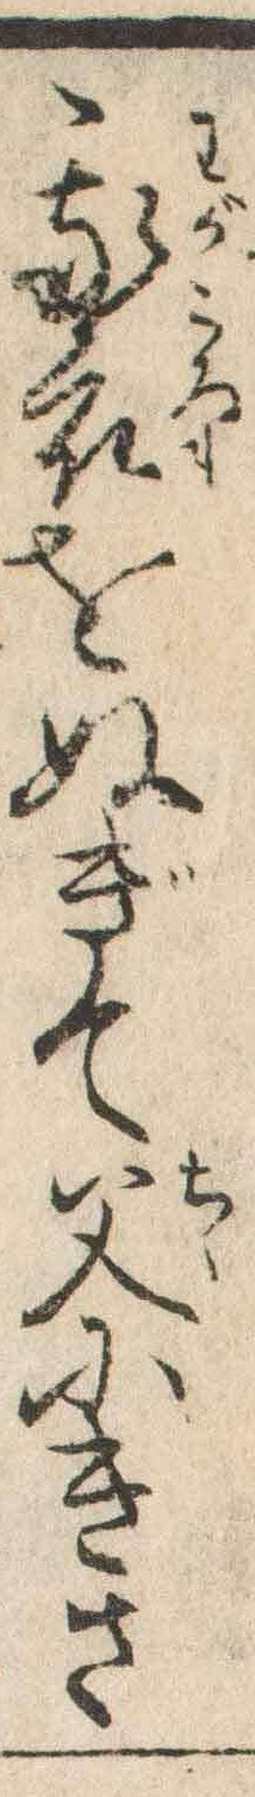我衣をぬぎて父にきさ
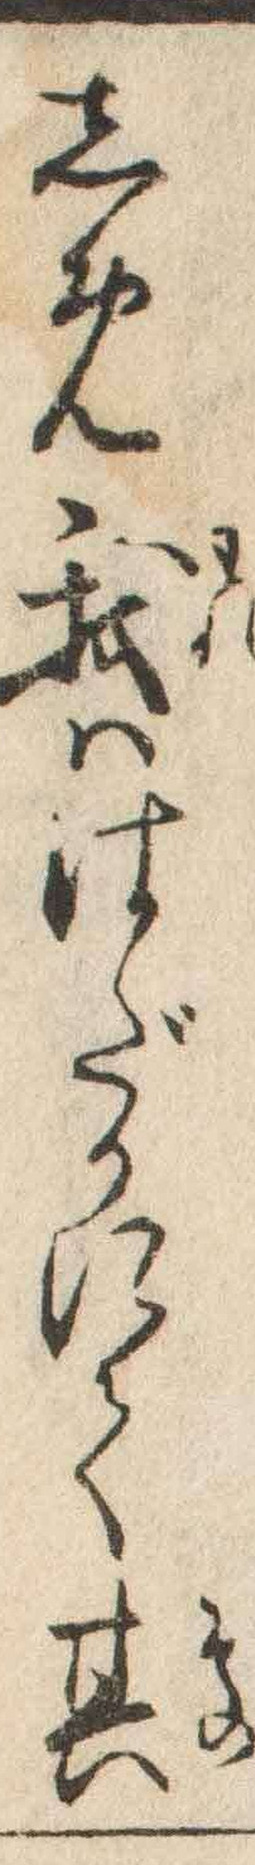しめ我ははだかにて其
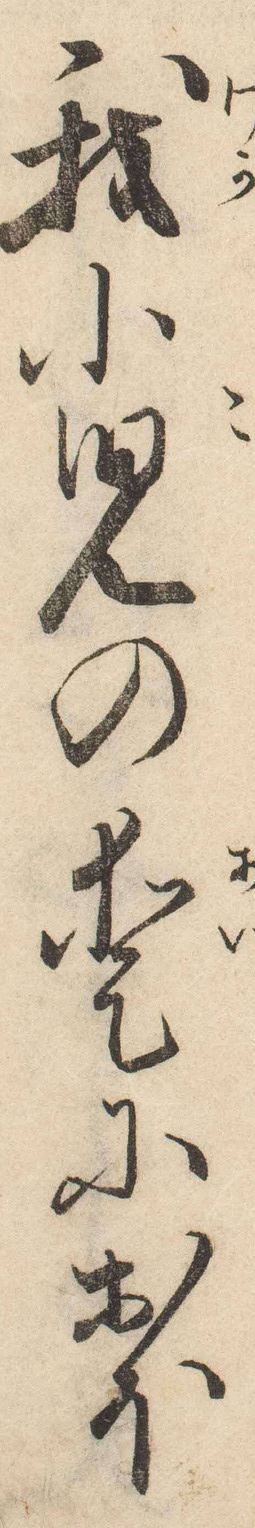我小児の愛におほ
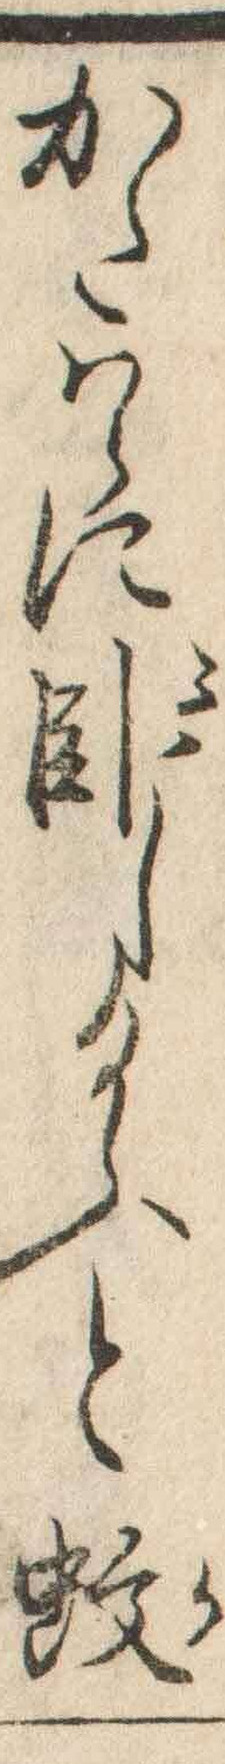かたわらに臥し給ふと蚊
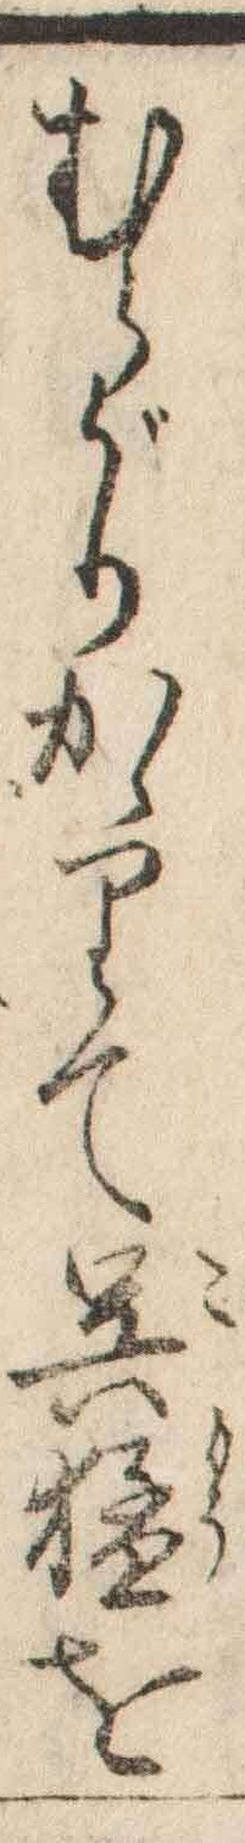むらがりかゝりて呉猛を
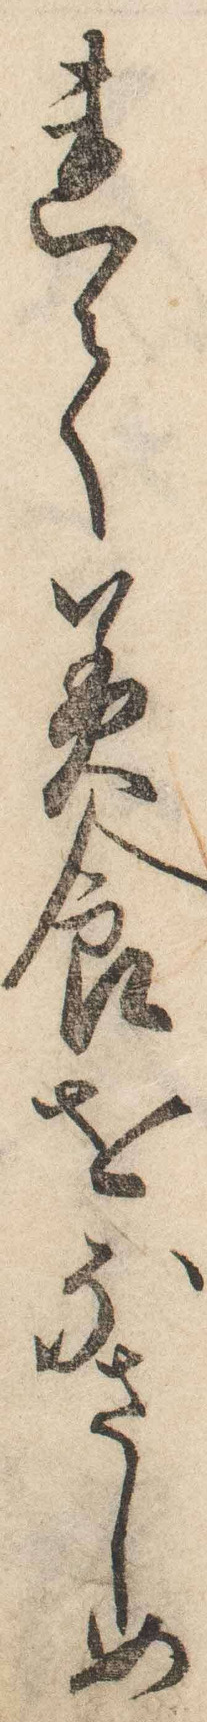れて美食をなさしめ
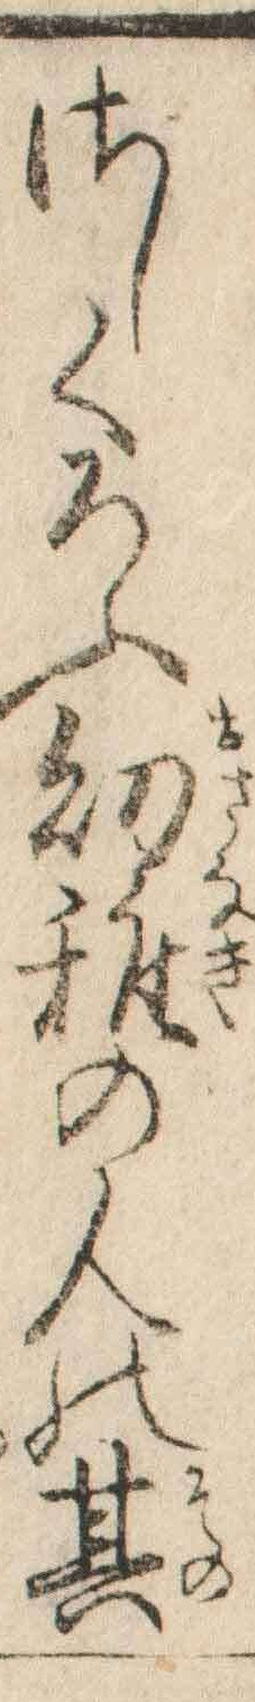さしくろふ幼稚の人の其
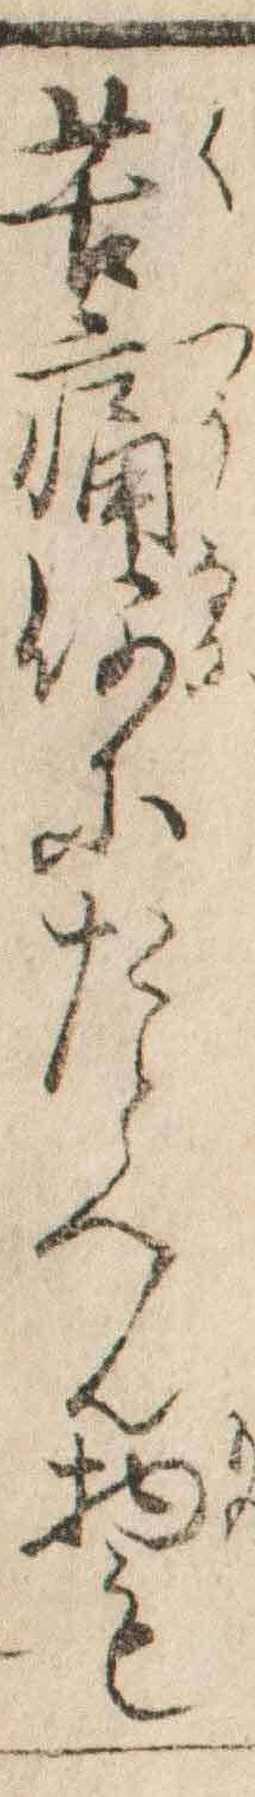苦痛何にたとへん物も
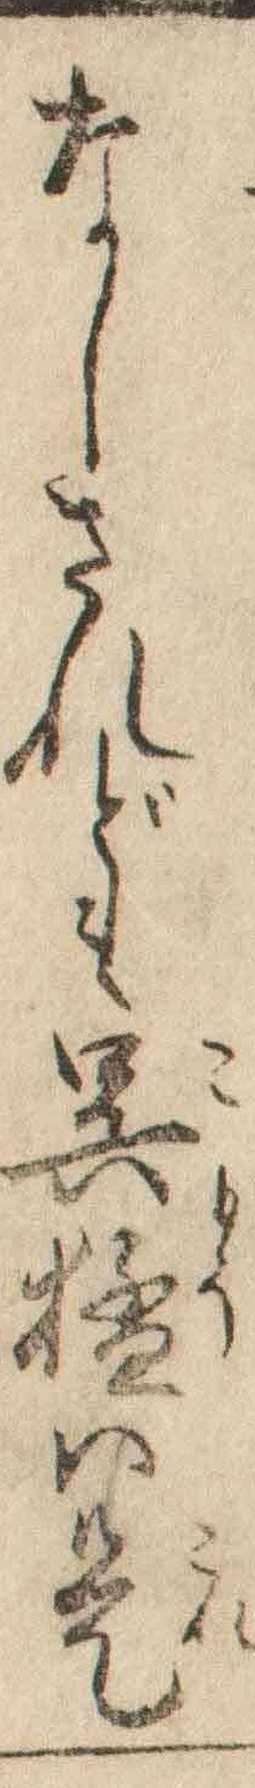なしされども呉猛は是
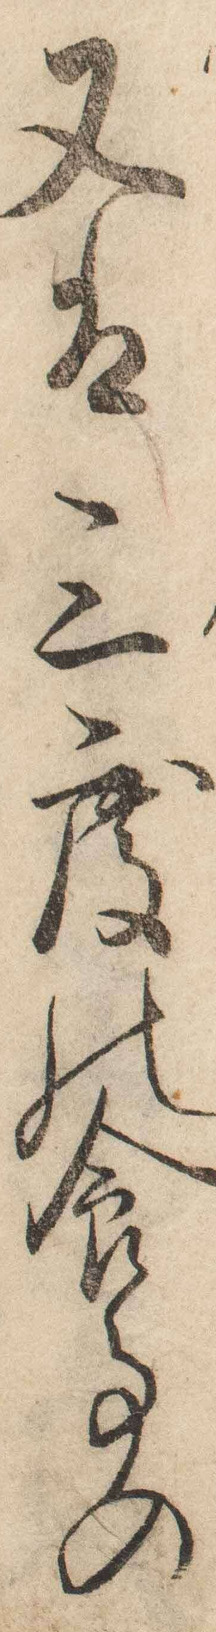又は三度の食事の

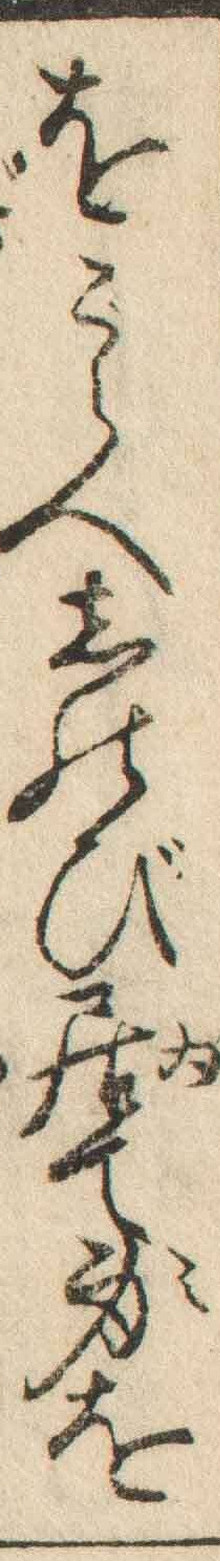をこらへしのび居て身を
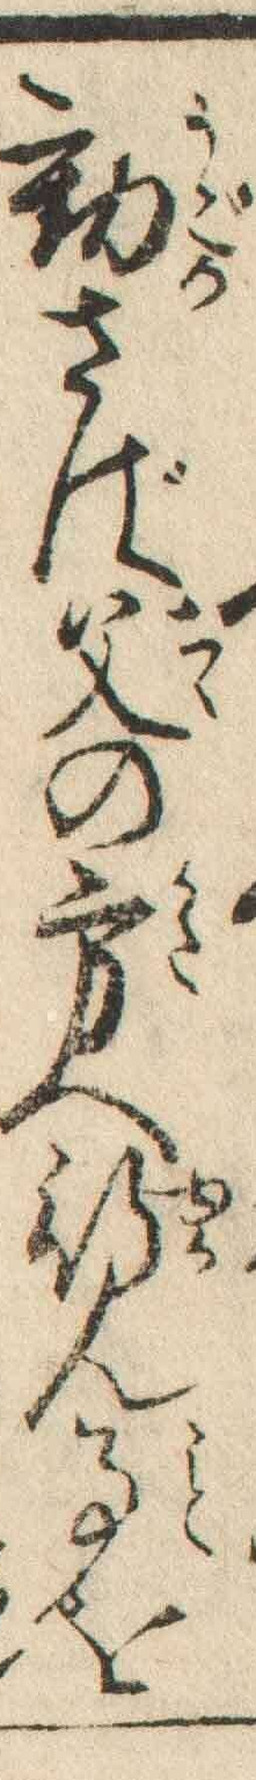動さば父の方へ行ん事を
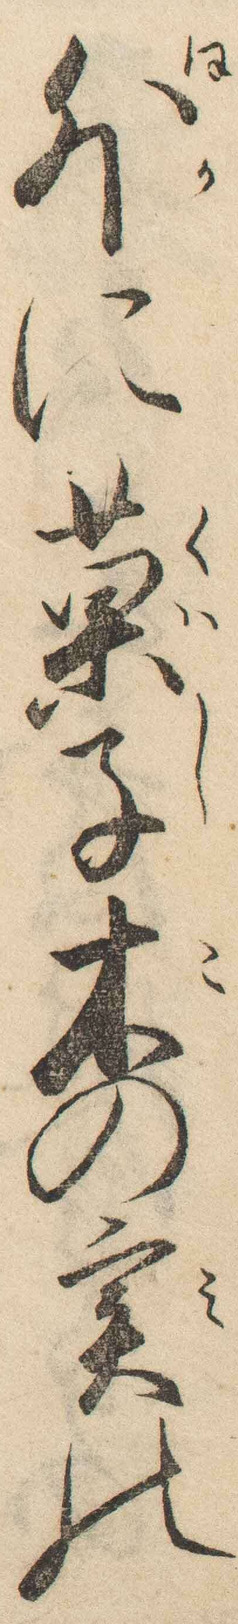外に菓子木の実の
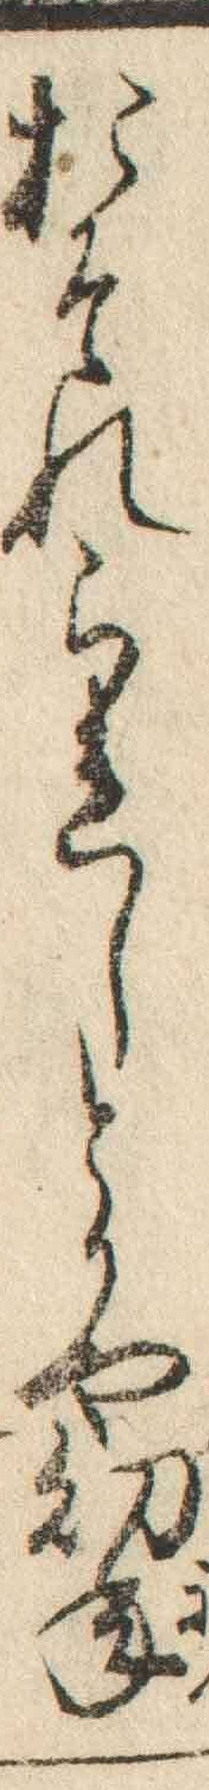おそれられしとかや幼年
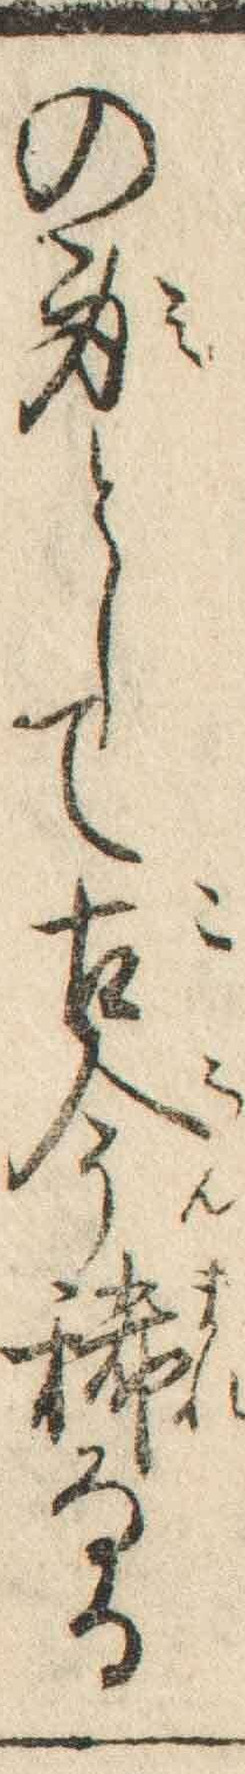の身として古今稀なる
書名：撫育草
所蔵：東京学芸大学附属図書館 国文学研究資料館
